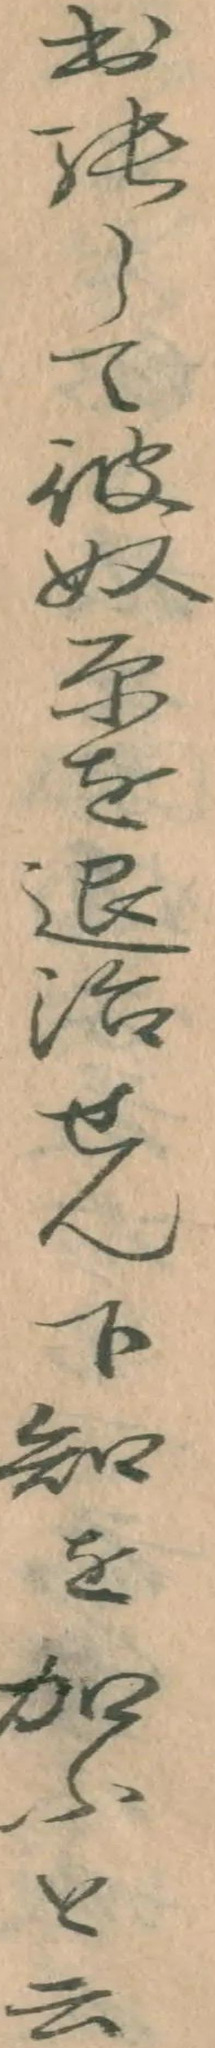出張して彼奴原を退治せん下知を加ふと云
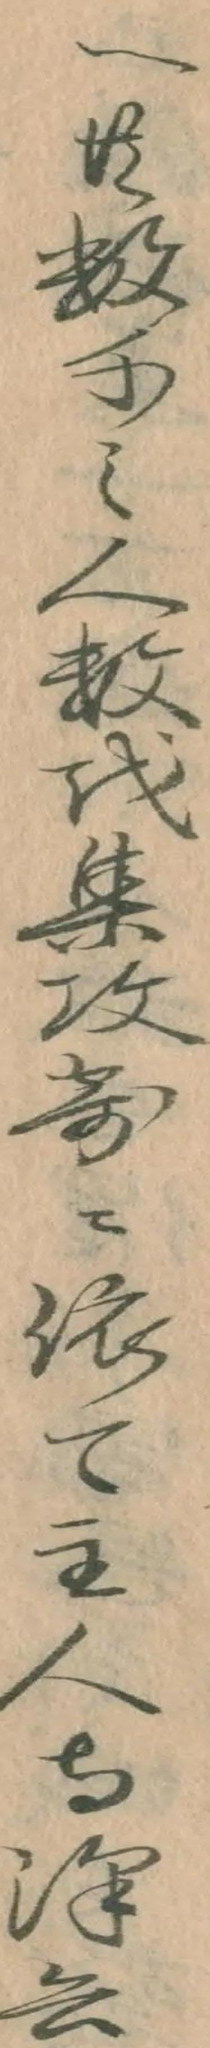へ共数千之人数越集攻寄に依て主人寺沢兵
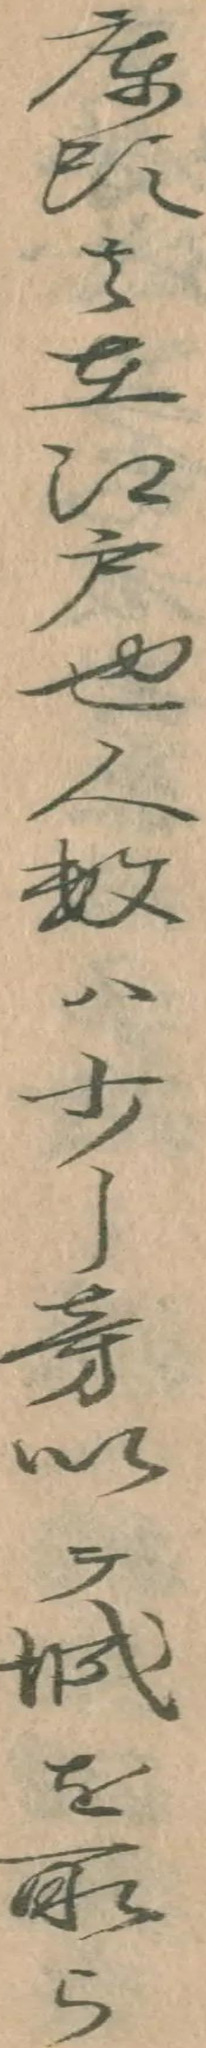庫頭者在江戸也人数は少し旁以て城を取ら
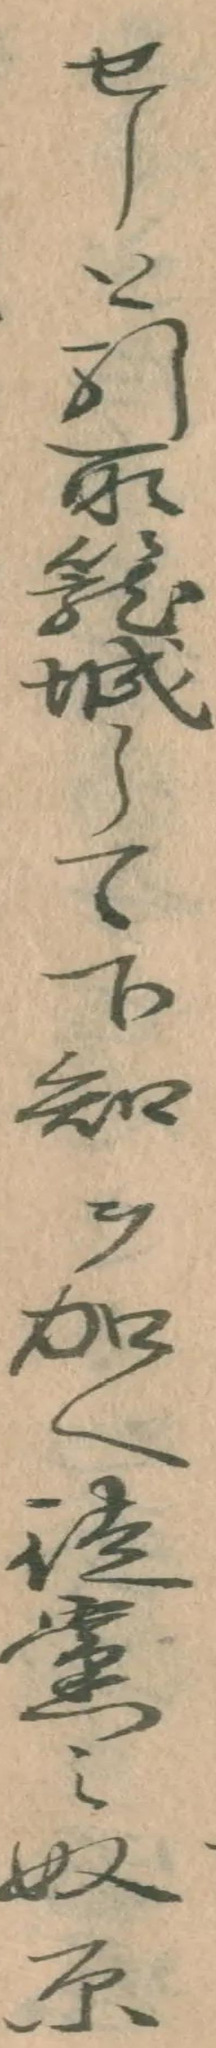せしと引取籠城して下知を加へ徒党之奴原
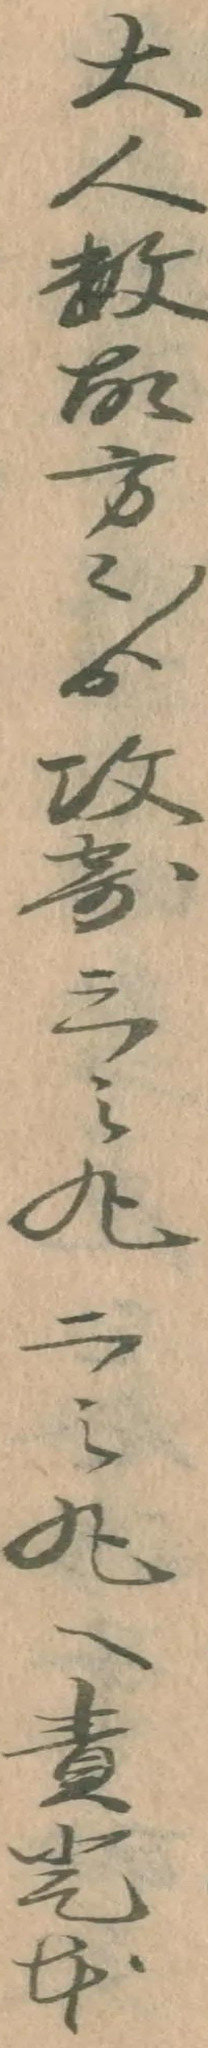大人数故方々ゟ攻寄三之丸二之丸へ責登本
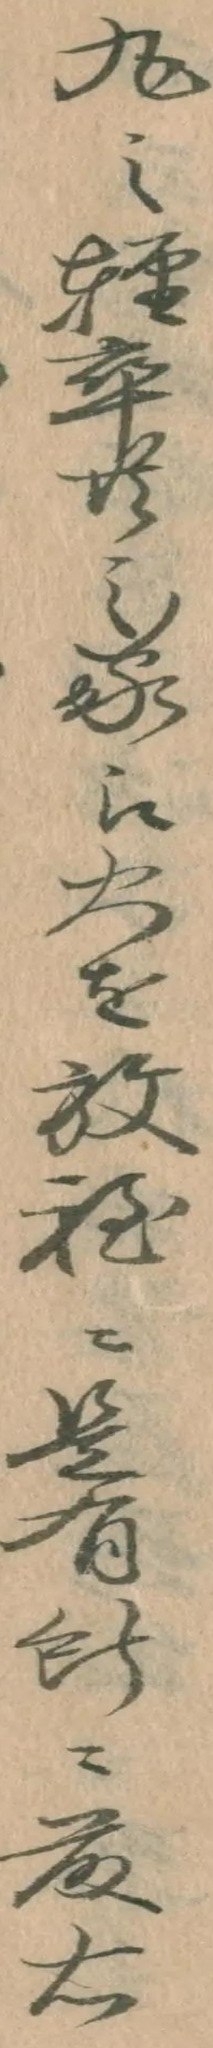丸之軽卒共之家江火を放程に是有所に藤右
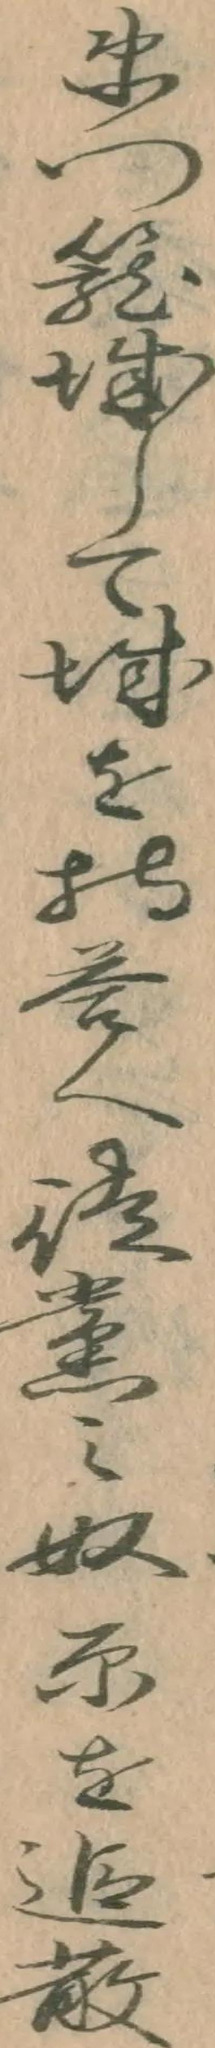衛門籠城して城を持答へ徒党之奴原を追散
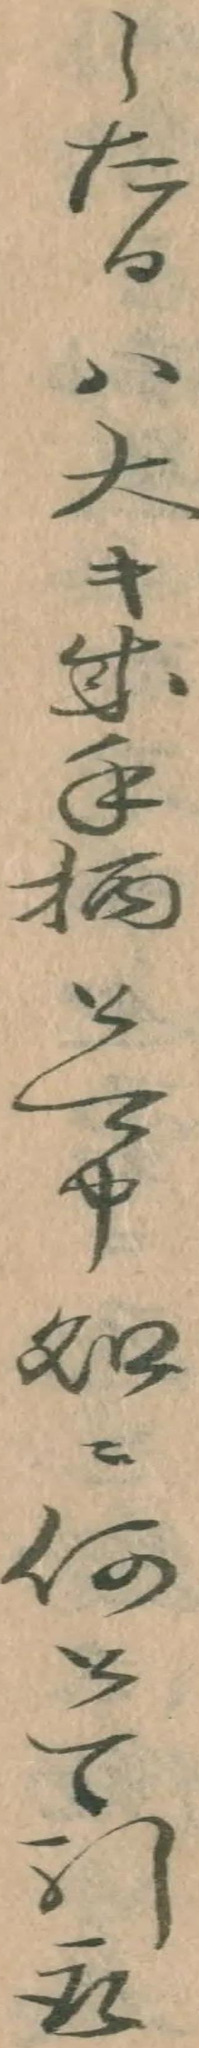したるは大き成手柄と可申処に何とて引取
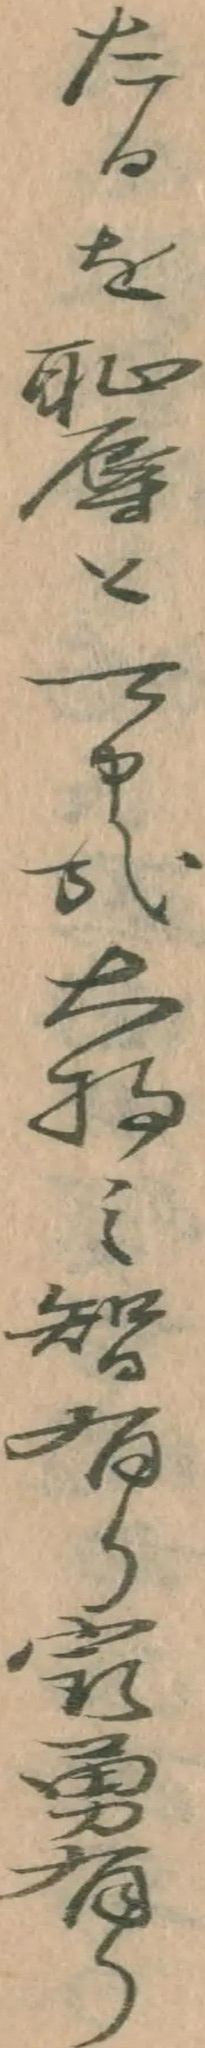たるを恥辱と可申哉大将之智有り最勇有り
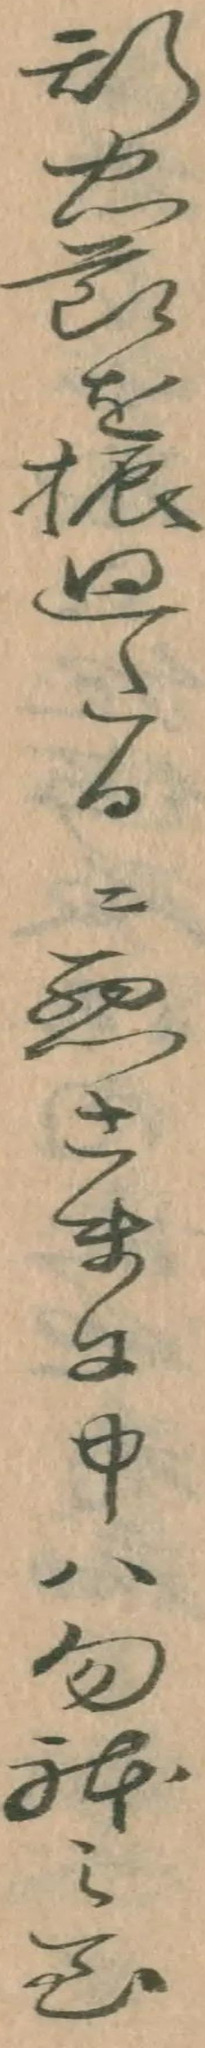斯忠節を根廻たるに悪さま尓申は勿躰之至
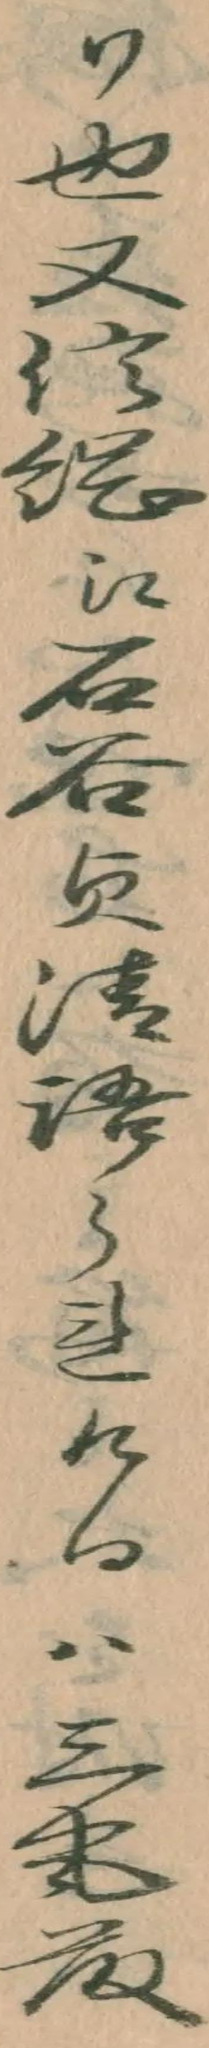り也又信綱江石谷貞清語ら連けるは三宅藤
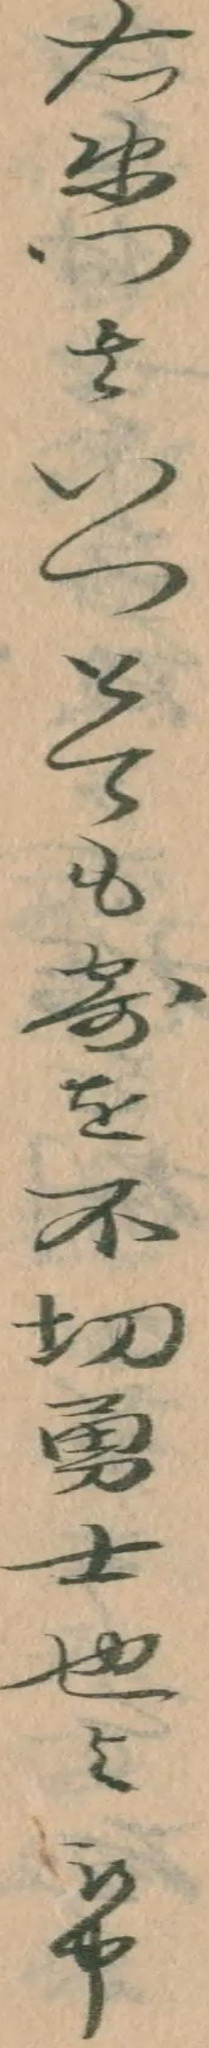右衛門者いつとても寄を不切勇士也与被申
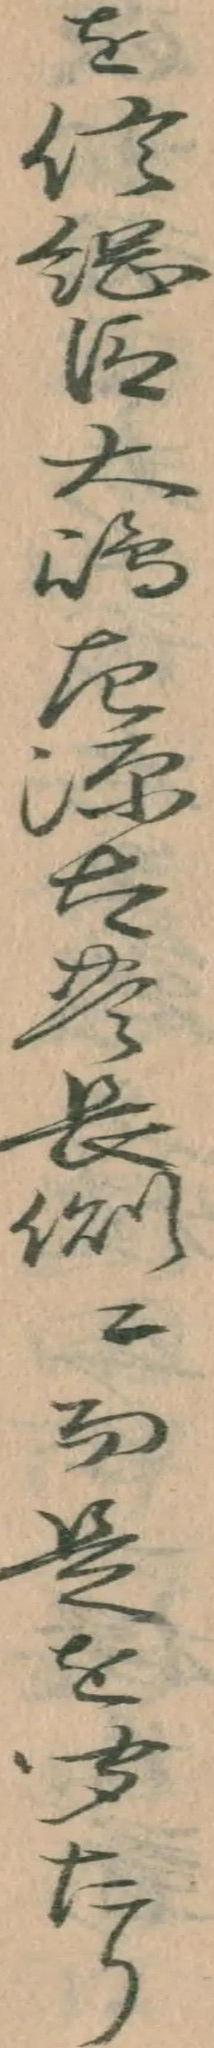を信綱臣大島左源太豊長倒に而是を聞たり
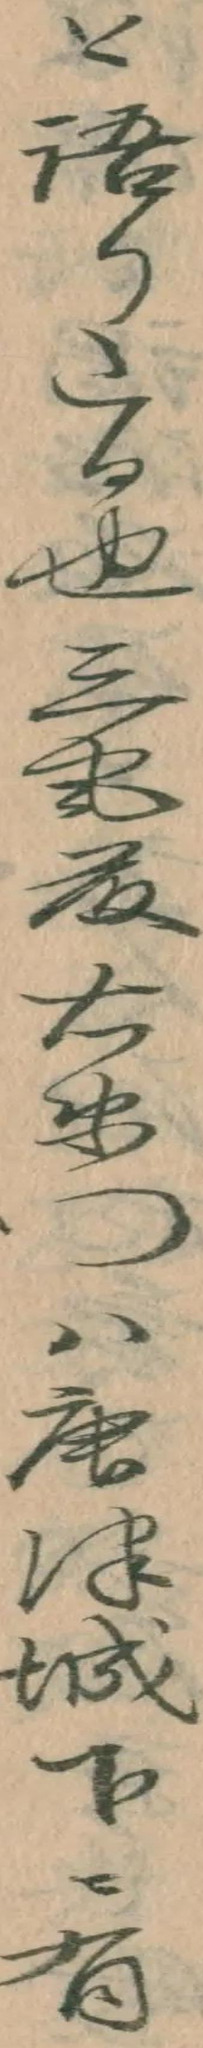と語りたる也三宅藤右衛門は唐津城下に有
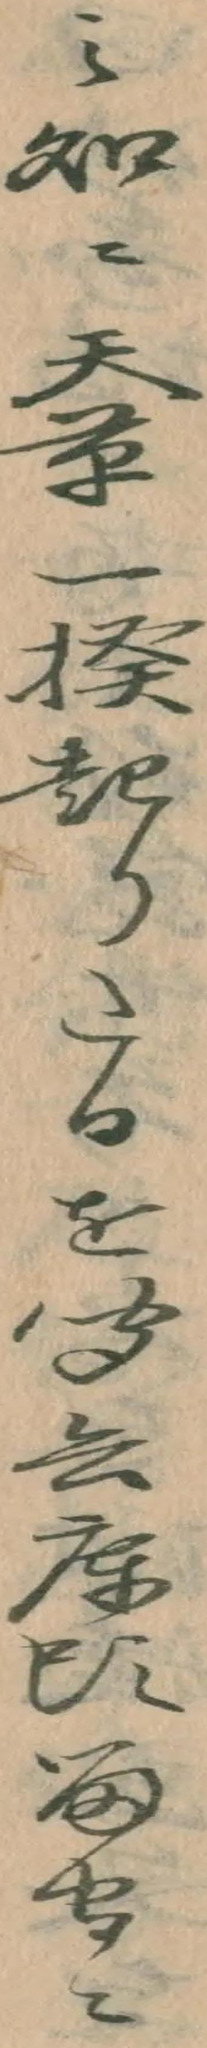之処に天草一揆起りたるを聞兵庫頭留守に
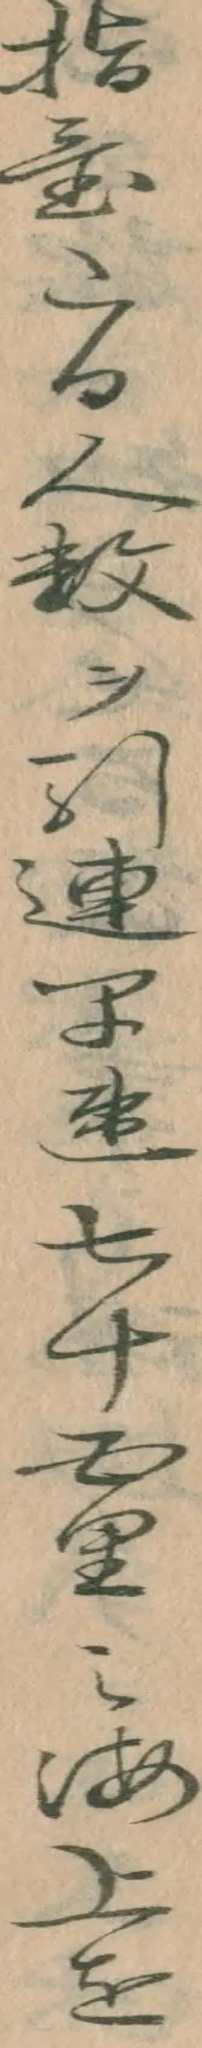指置たる人数を引連早速七十五里之海上を
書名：切支丹御退治記 49巻. [7]
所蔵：国立国会図書館 National Diet Library, JAPAN
